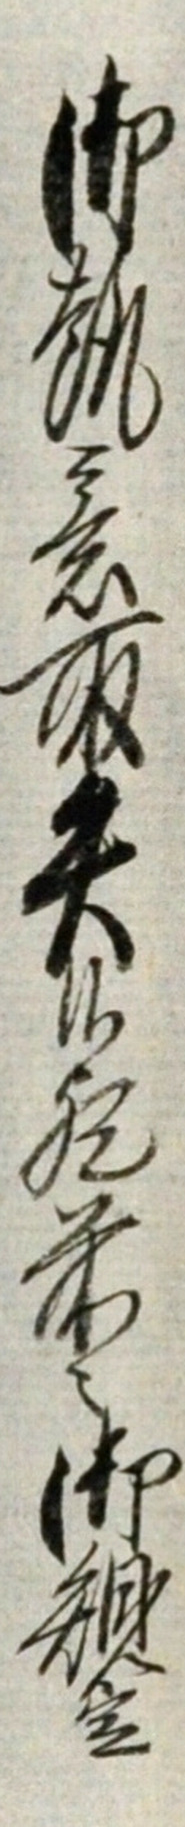御趣意取失候歟前々御規定
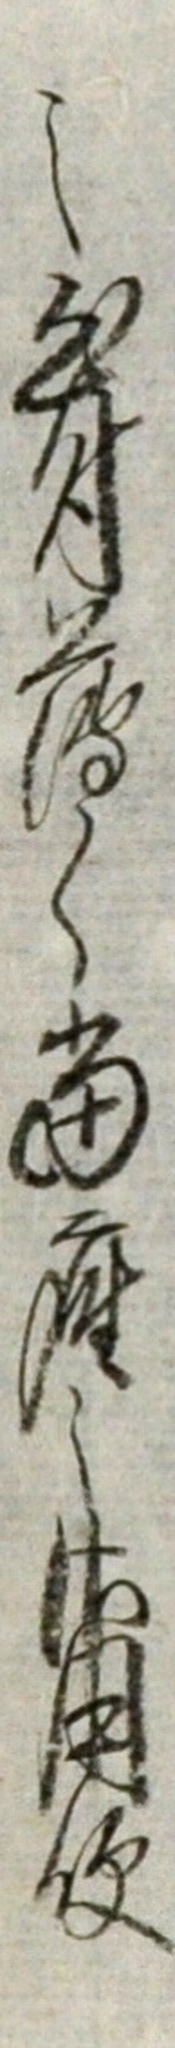之心付薄く当座之御用便

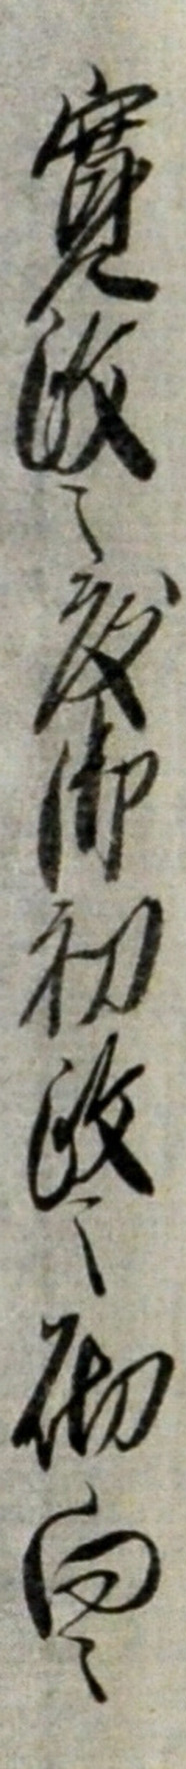寛政之儀御初政之砌向々
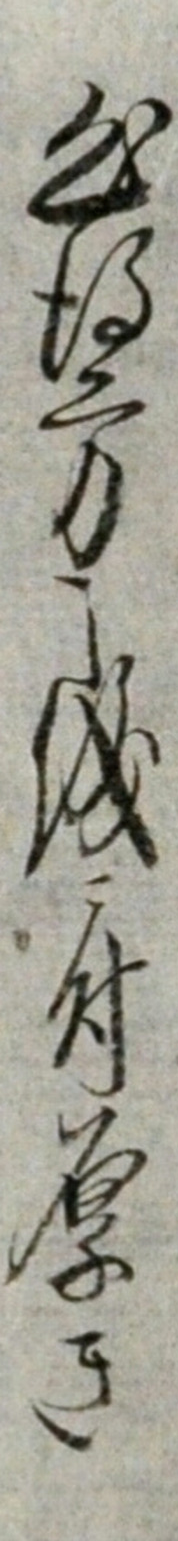心得方之儀付厚き
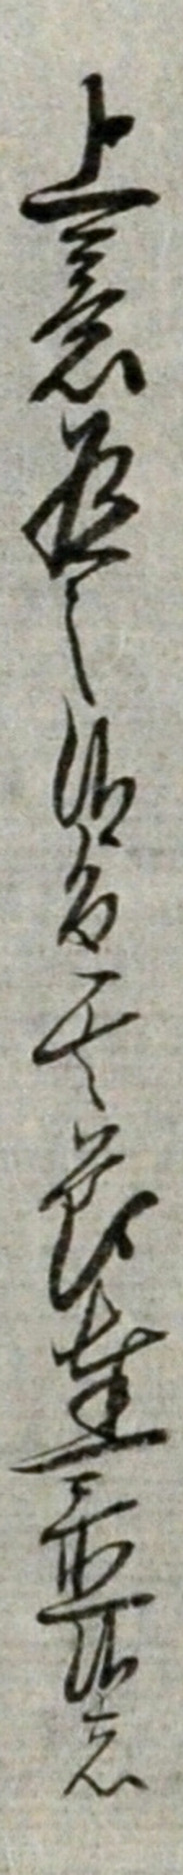上意有之候旨其節達置候者
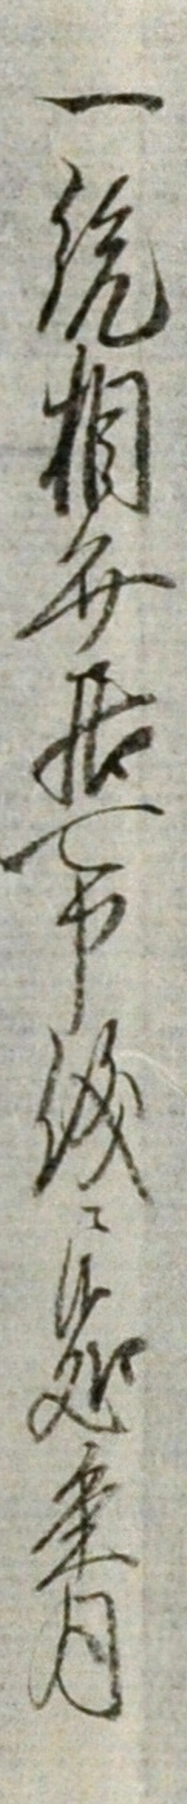一統相弁居可申儀候処秊月
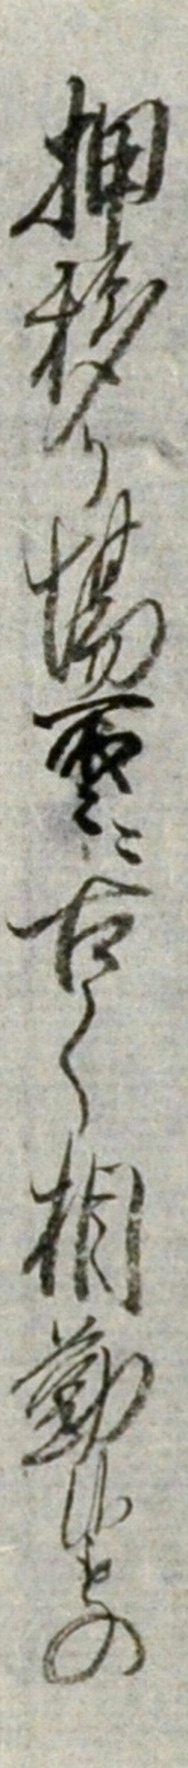押移り場取々古く相勤候もの
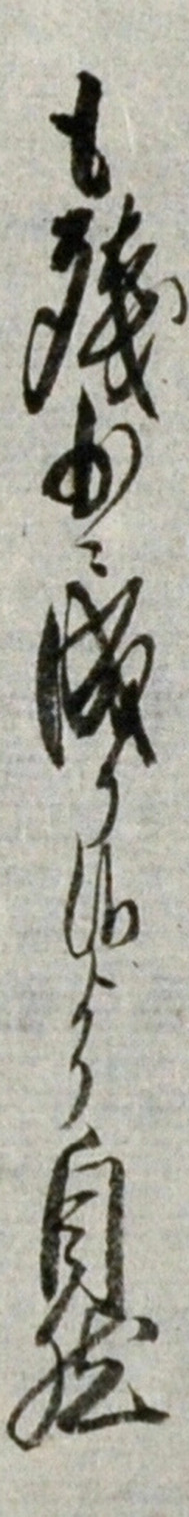も残少ニ成り候より自然
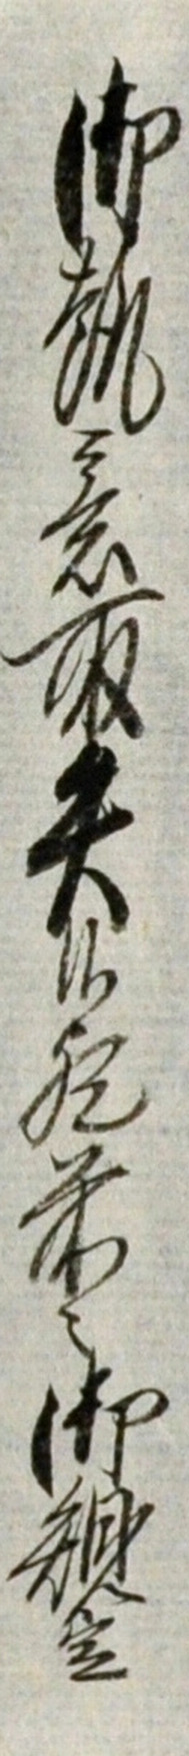御趣意取失候歟前々御規定
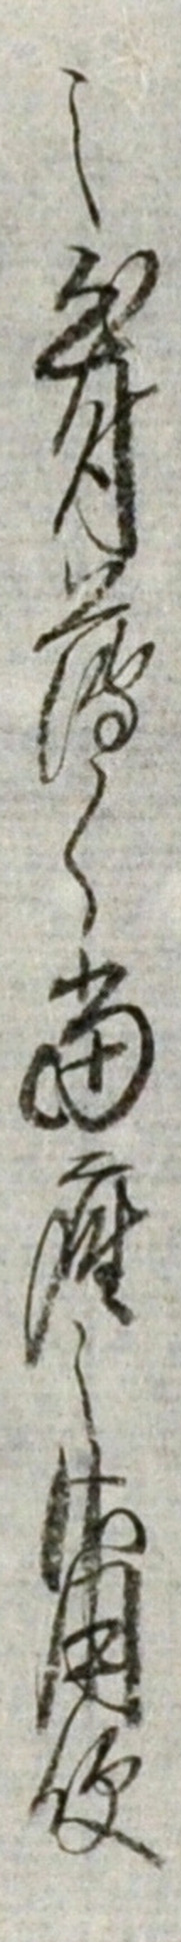之心付薄く当座之御用便
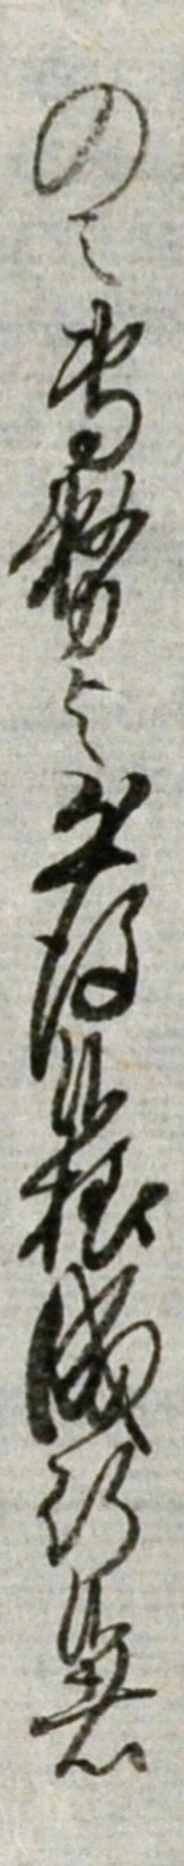の之専務と心得候様成行候者
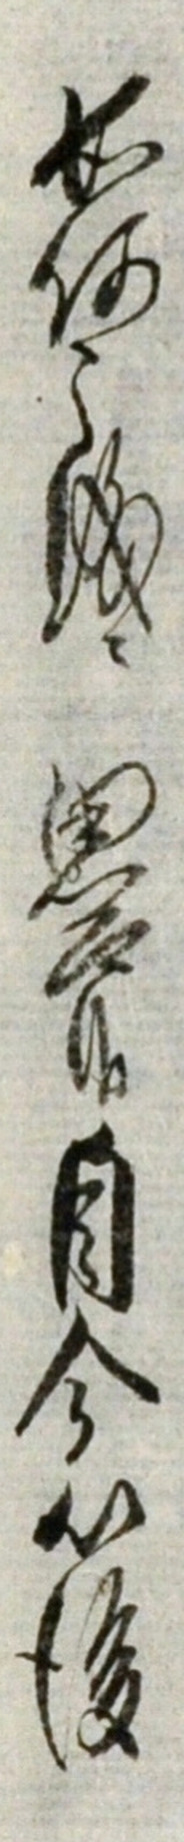如何之儀ニ思召候自今以後
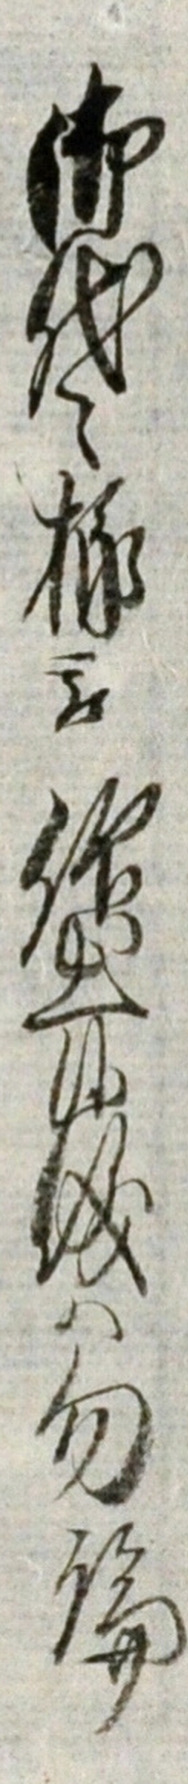御代々様被仰出候儀ハ勿論
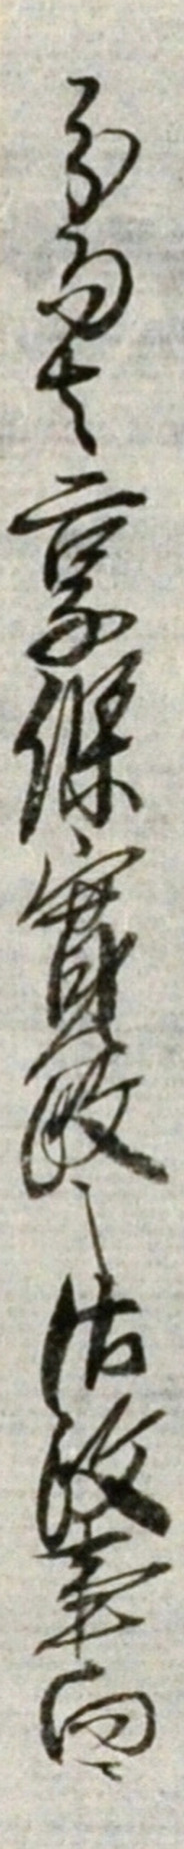分句者享保寛政之御政事向ニ
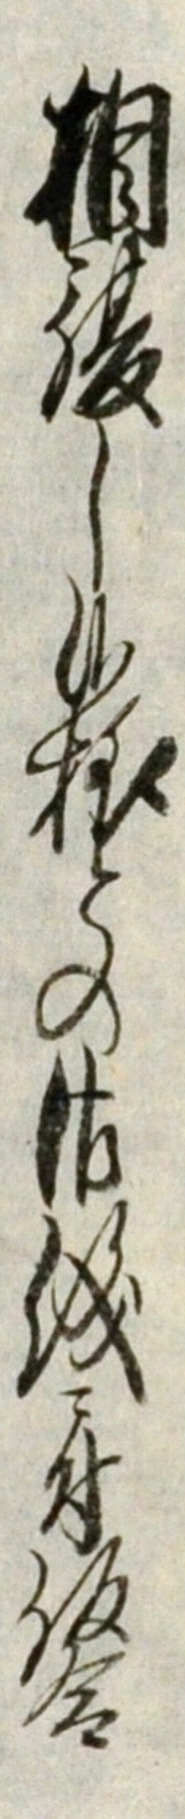相渡し候様との御儀ニ付仮合
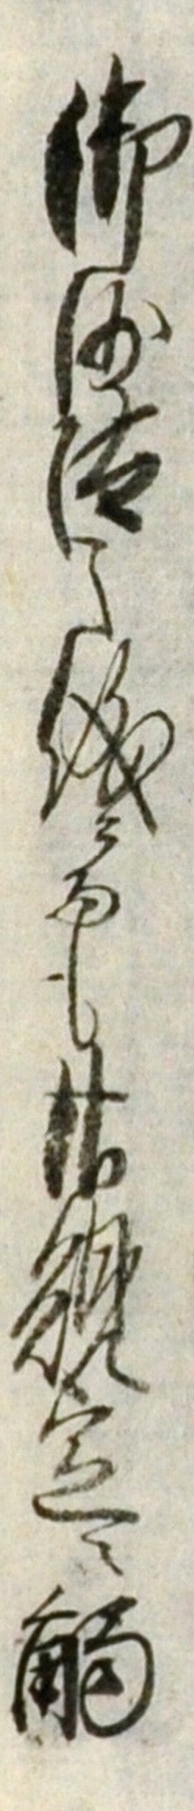御沙汰之儀ニ而も御規定ニ触
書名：若年寄御役中御調書付
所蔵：伊那市立高遠町図書館・合同会社AMANE
